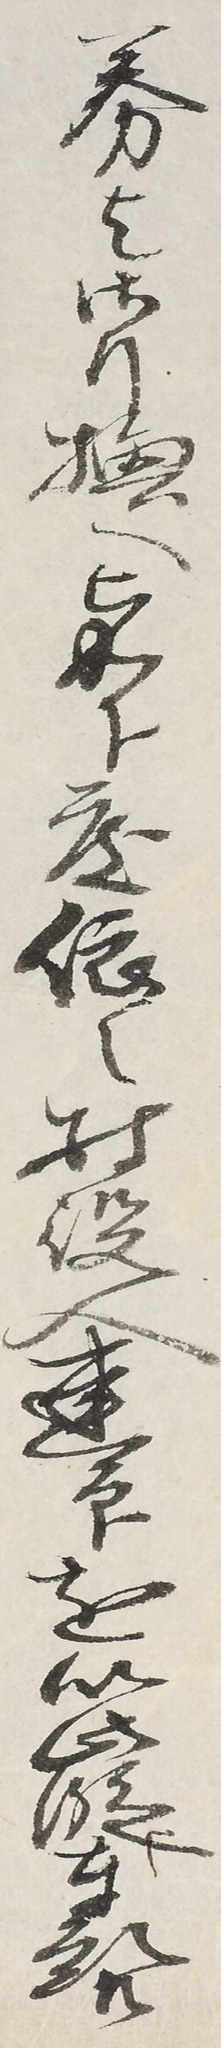券与御行換へ被成下度依之村役人連印を以此段奉願候
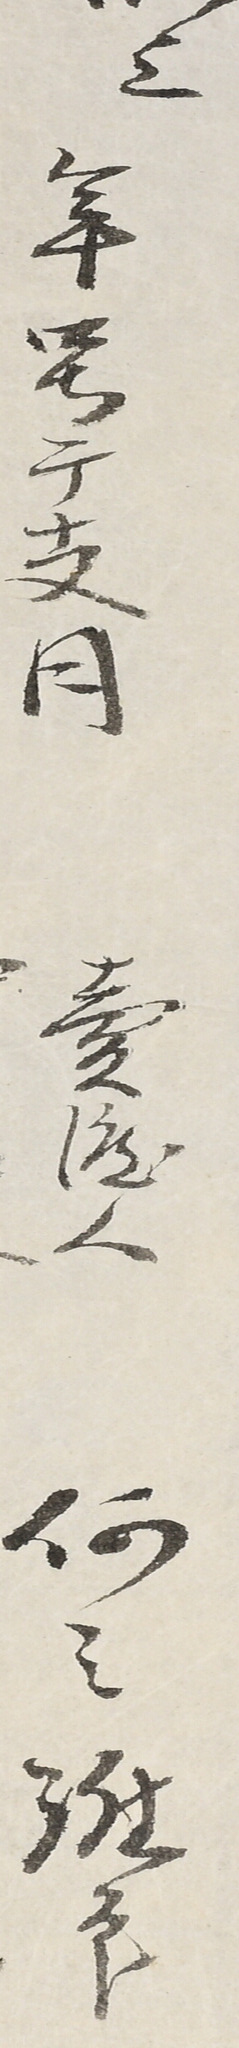年号干支月売渡人何之誰印
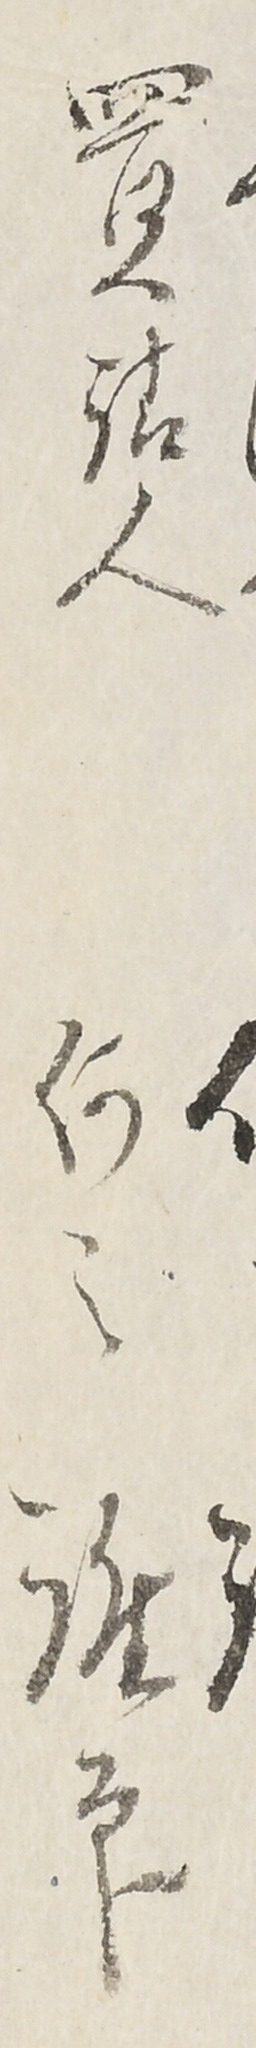買請人何之誰印
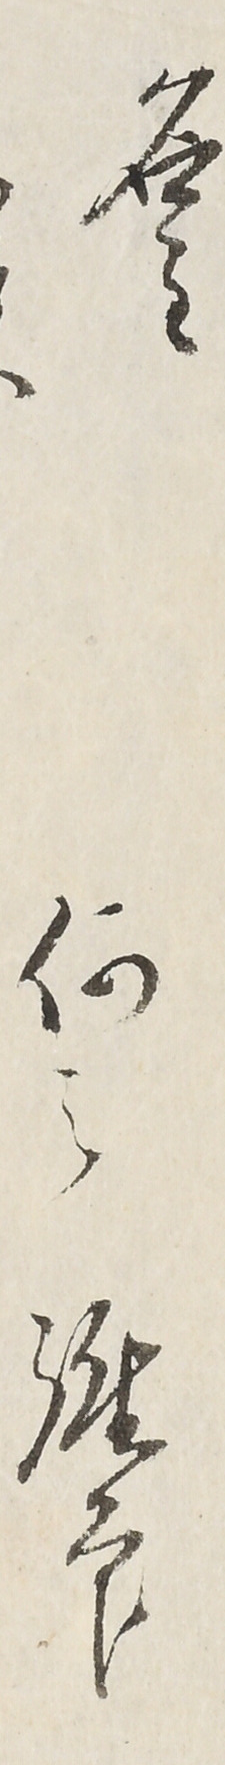名主何之誰印
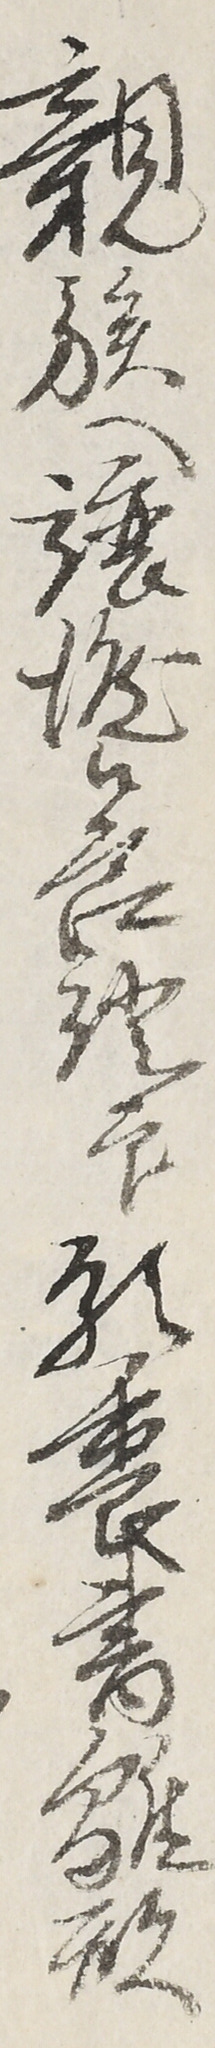親族へ譲渡候節証印願裏書雛形
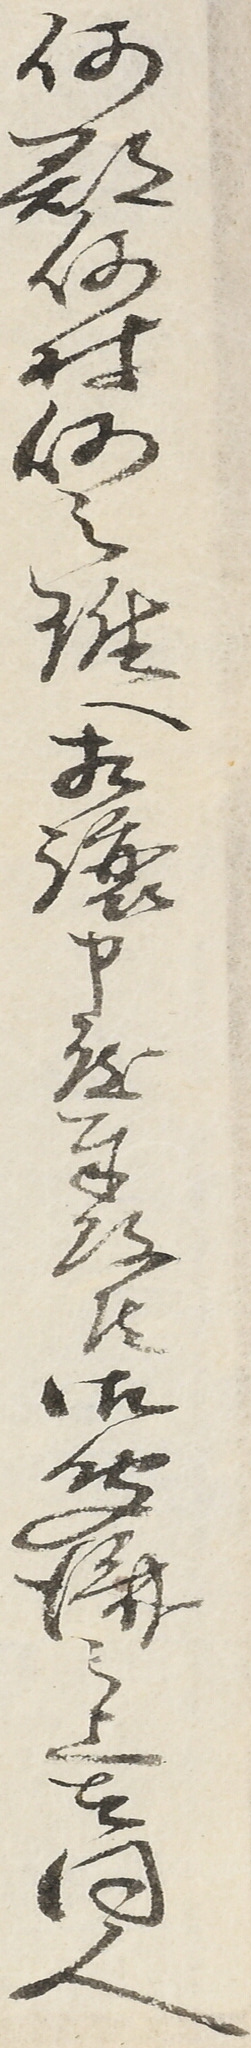何郡何村何之誰へ相譲申度奉存候御聞済之上を同人
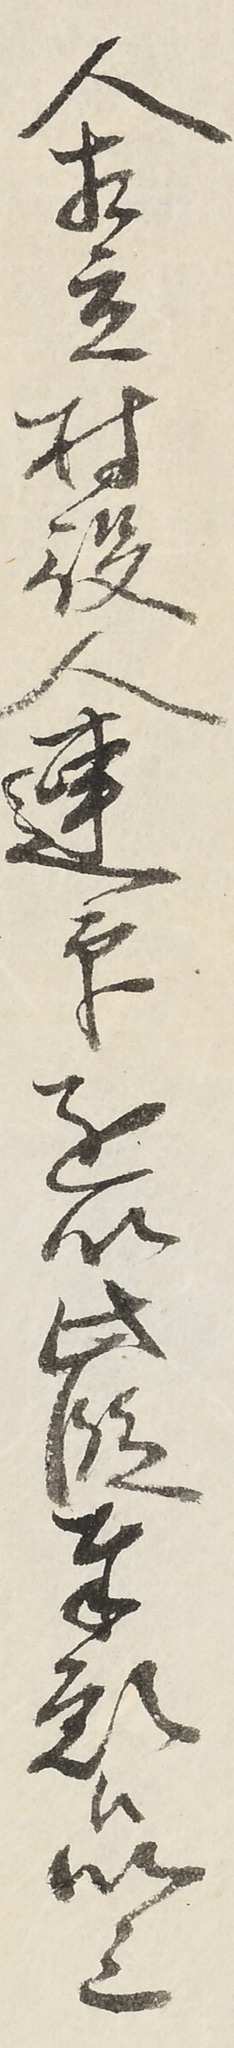人相立村役人連印を以此段奉願候以上
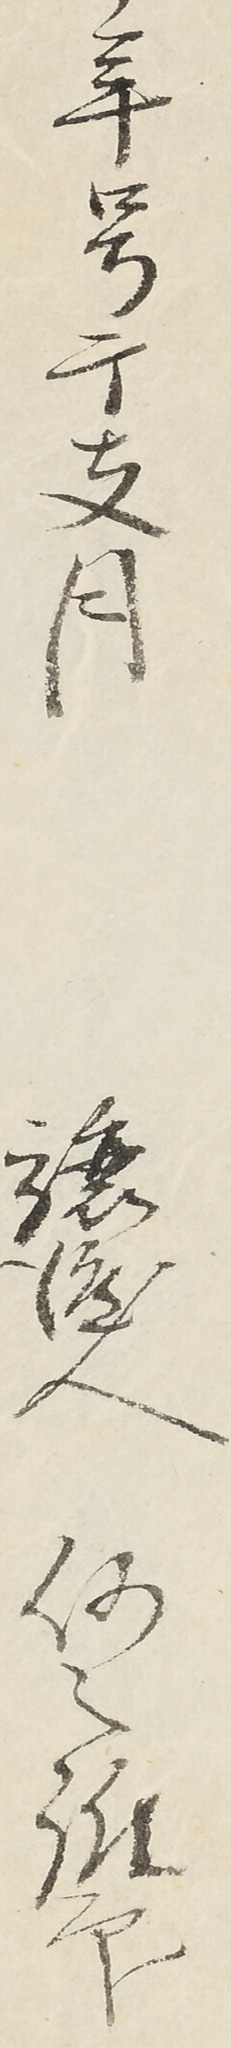年号干支月譲渡人何之誰印
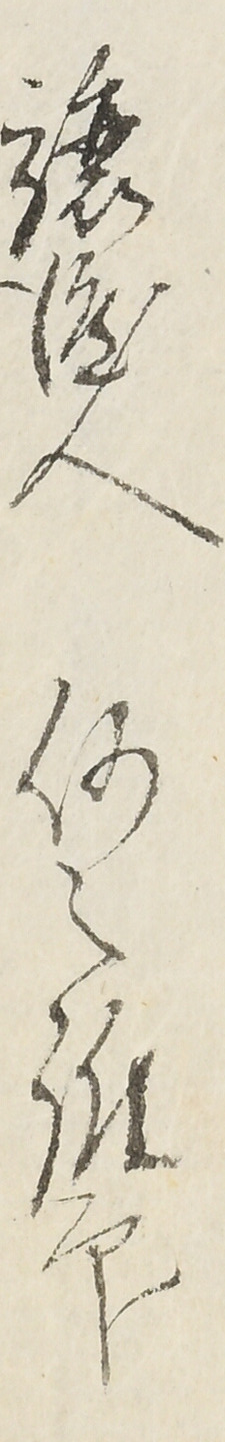譲請人何之誰印
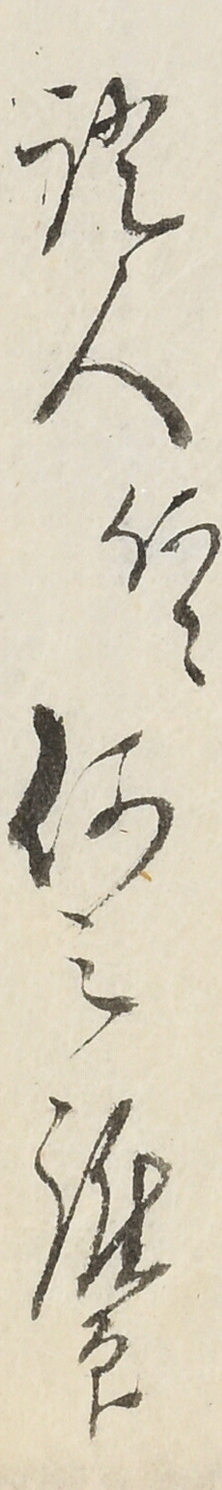証人何々何之誰印
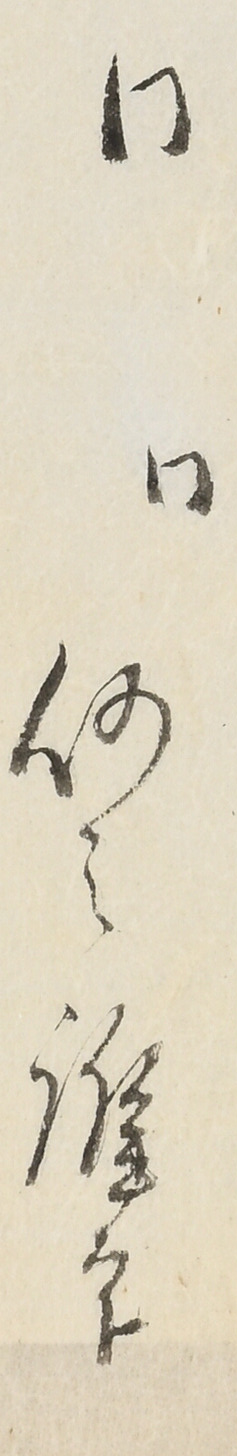同同何之誰印

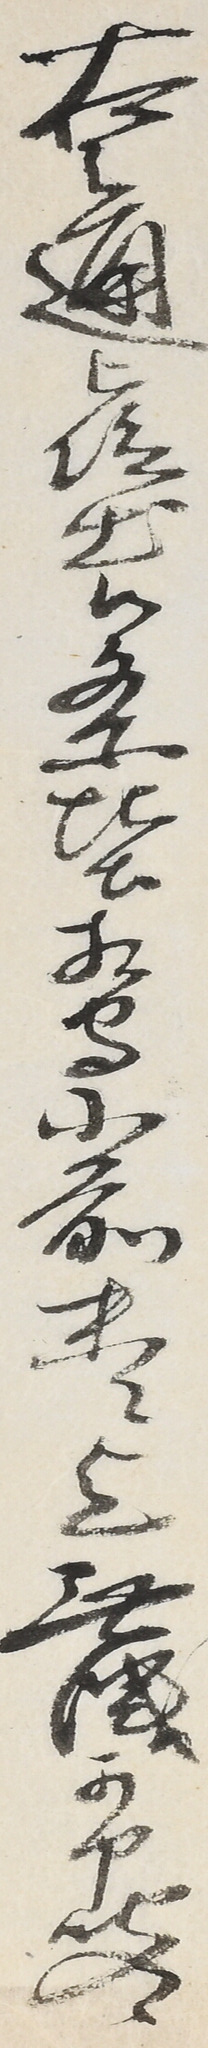右之通被仰出候条堅相守小前末々迄無洩可申聞候
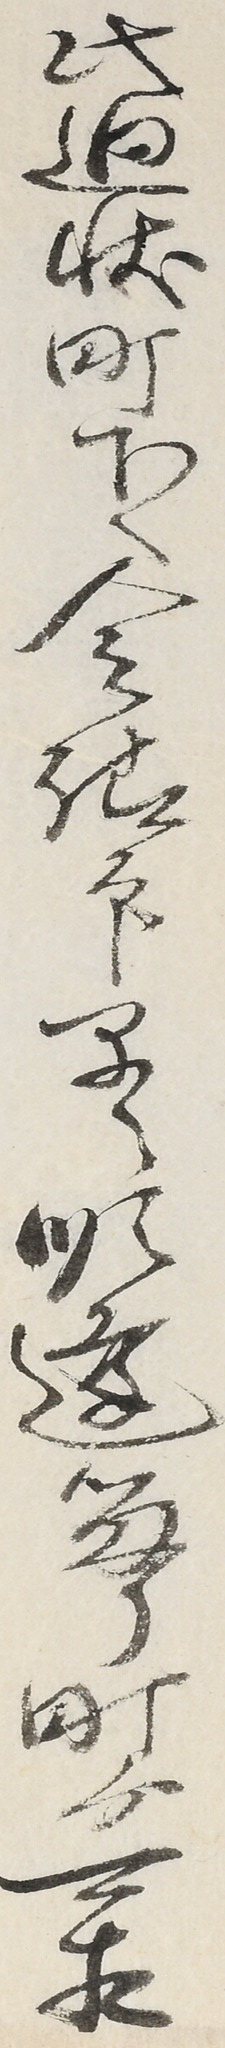此廻状町下へ人之請印早々順達留り町ゟ可相
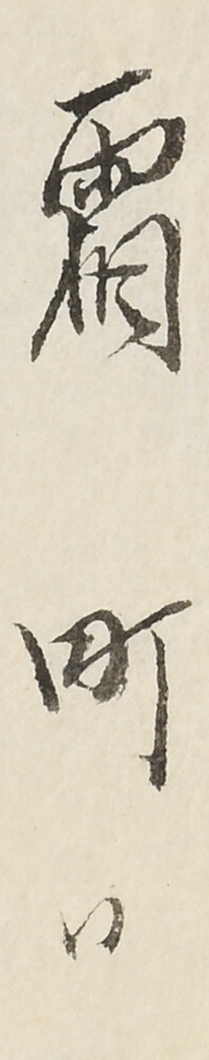霜町同
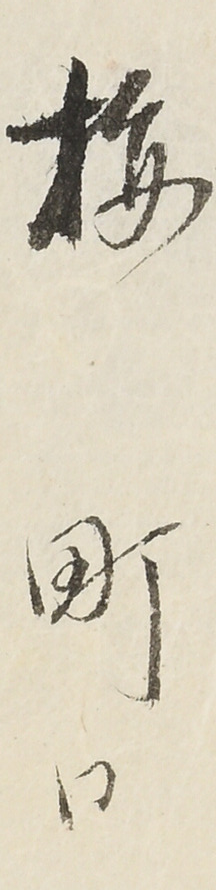梅町同
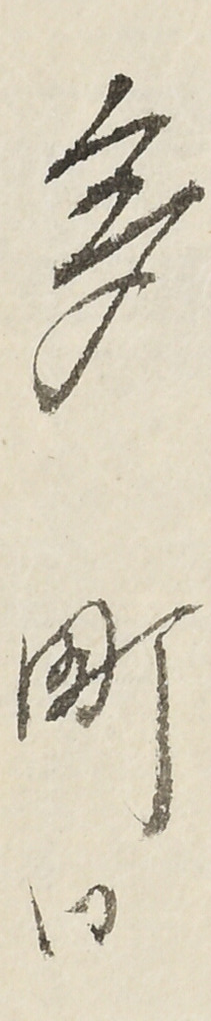多町同
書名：廻状（控）
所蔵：伊那市立高遠町図書館・合同会社AMANE
